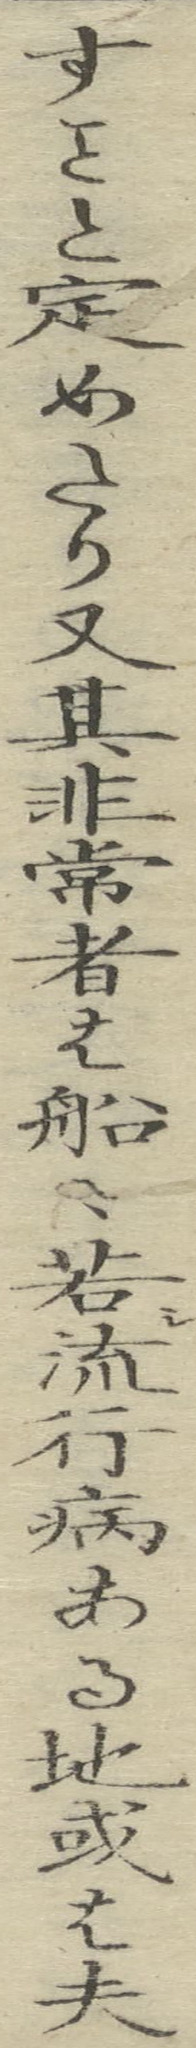すことと定めたり又其非常者は船々若流行病ある地域は夫
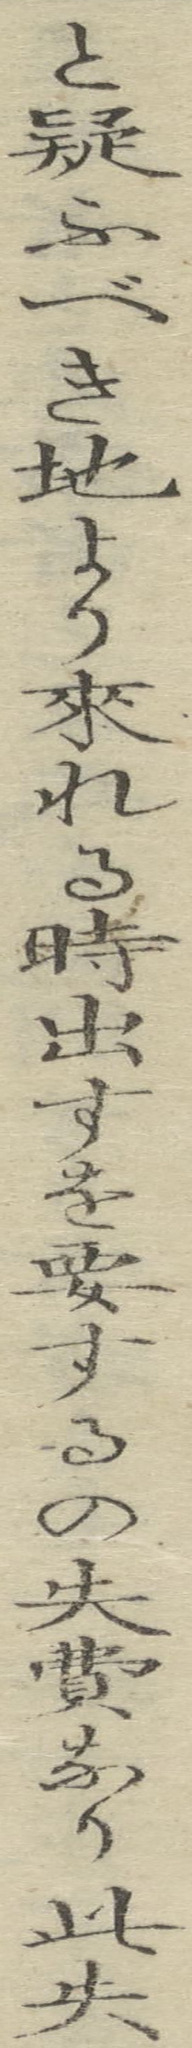と疑ふべき地より來れる時出すを要するの失費なり此失
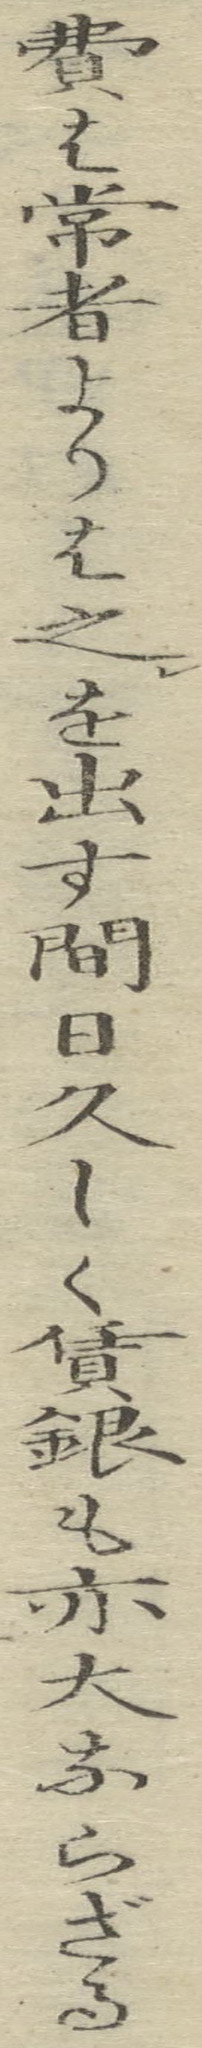費は常者よりは之出す間日久しく賃銀も亦大ならざる
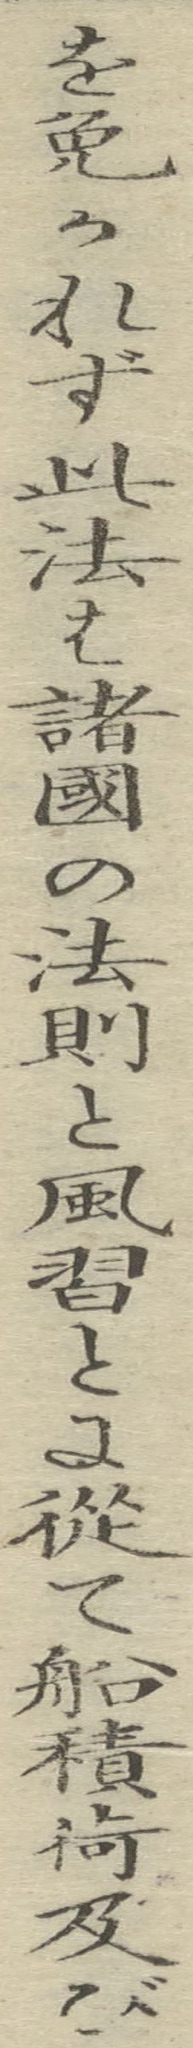を免かれず此法は諸國の法則と風習とに従て船積荷及び
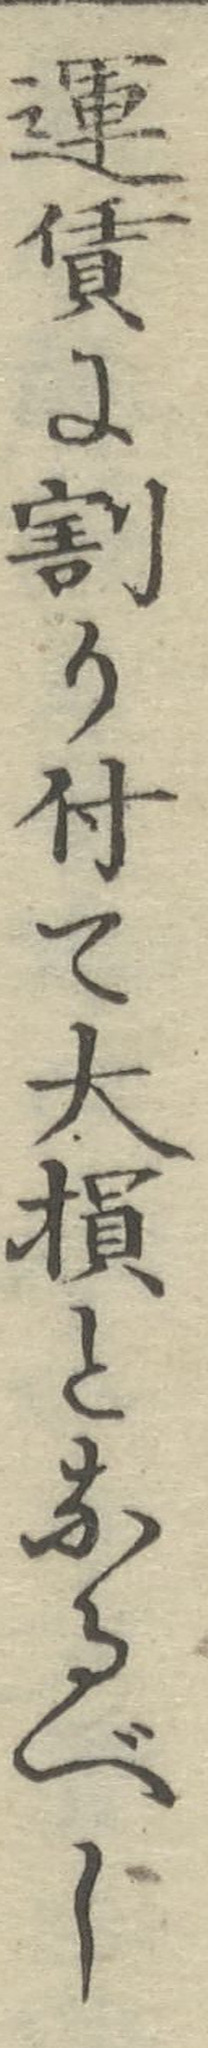運賃に割り付て大損となるべし
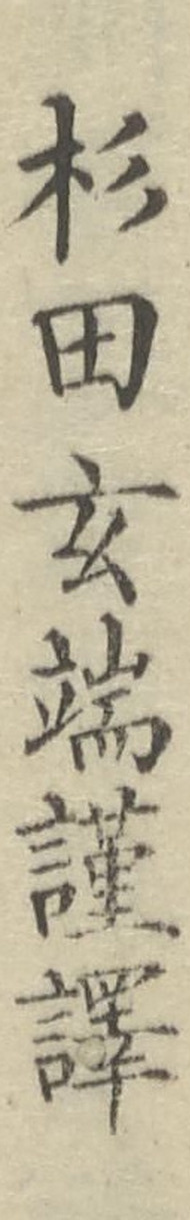杉田玄端謹譯
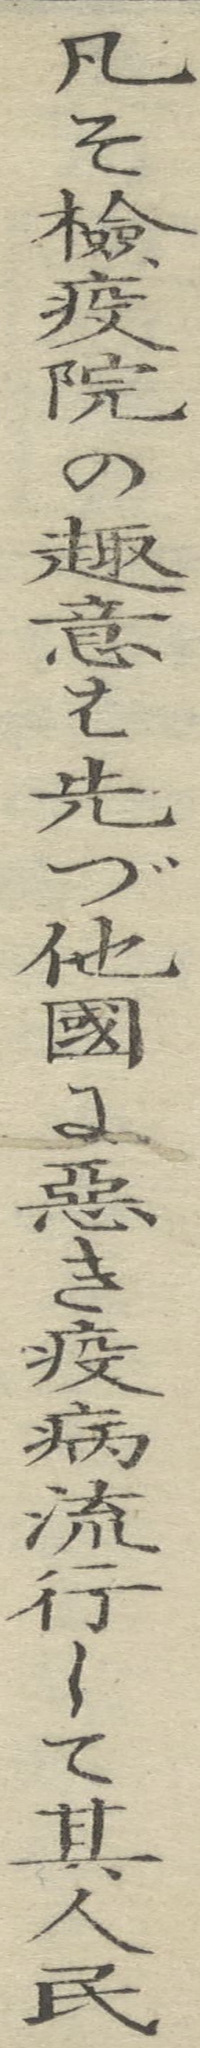凡そ檢疫院の趣意は先づ他國に惡き疫病流行して其人民
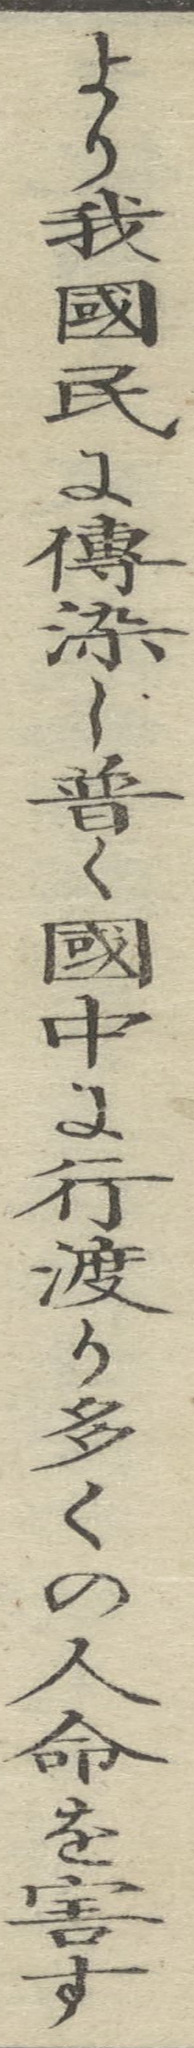より我國民に傅染し普く國中に行渡り多くの人命を害す
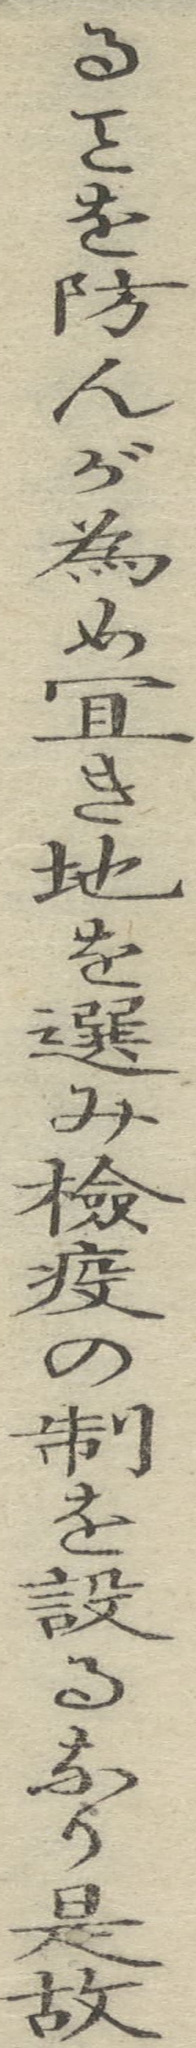ることを防んが為め冝き地を選み檢疫の制を設るなり是故
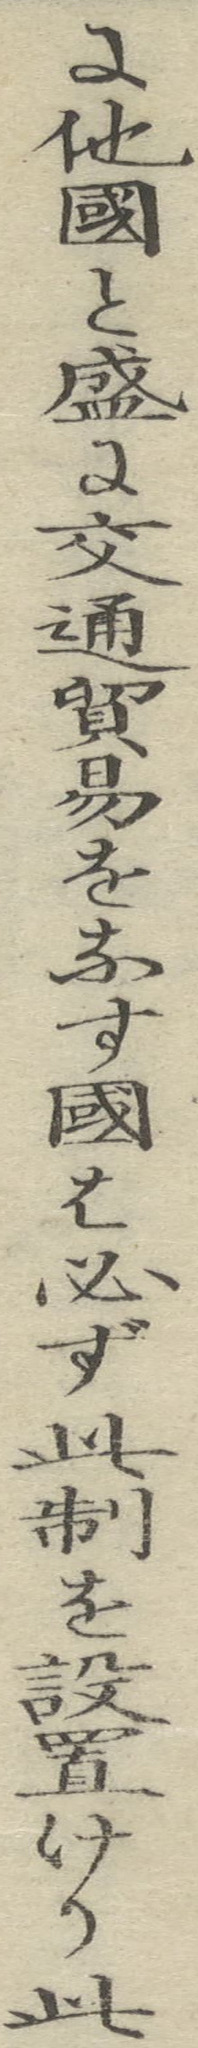に他國と盛に交通貿易をなす國は必ず此制を設置けり此
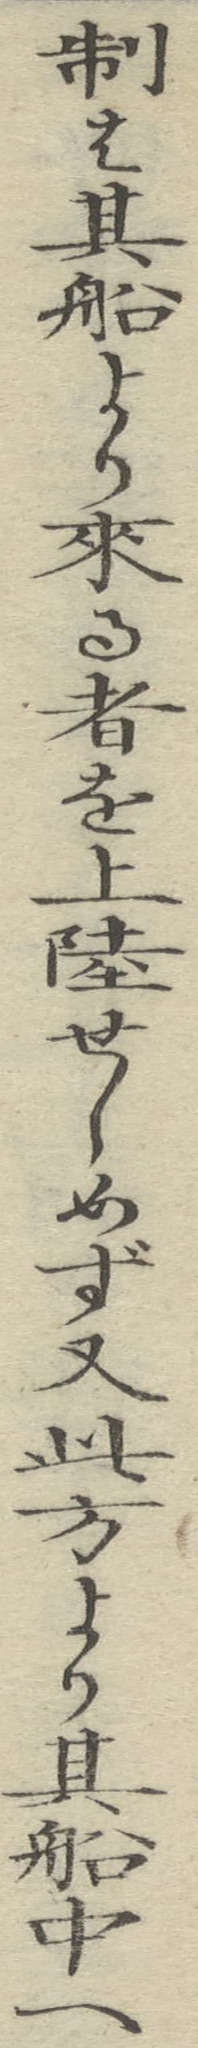制は其船より來る者を上陸せしめず又此方より其船中へ
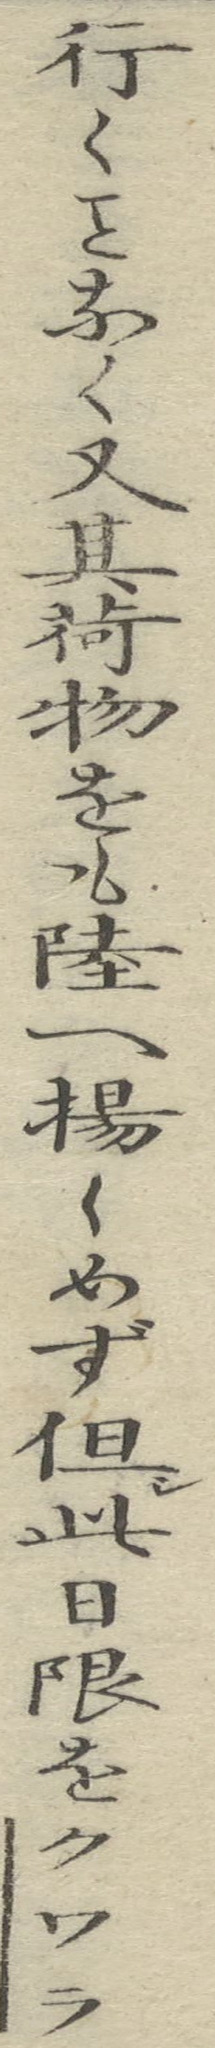行くことなく又其荷物をも陸へ揚しめず但此日限をクワラ
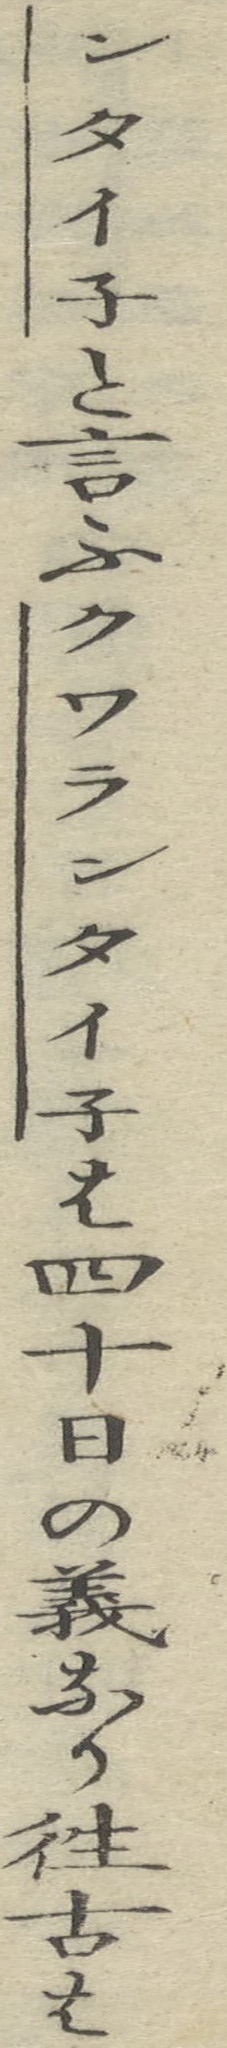ンタイネと言ふクワランタイネは四十日の義なり往古は
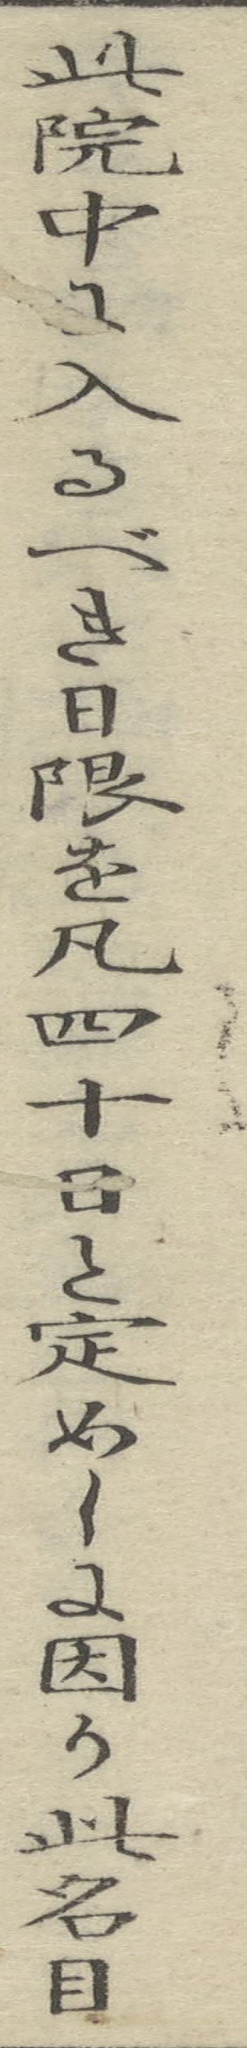此院中に入るべき日限を凡四十日と定めしに因り此名目
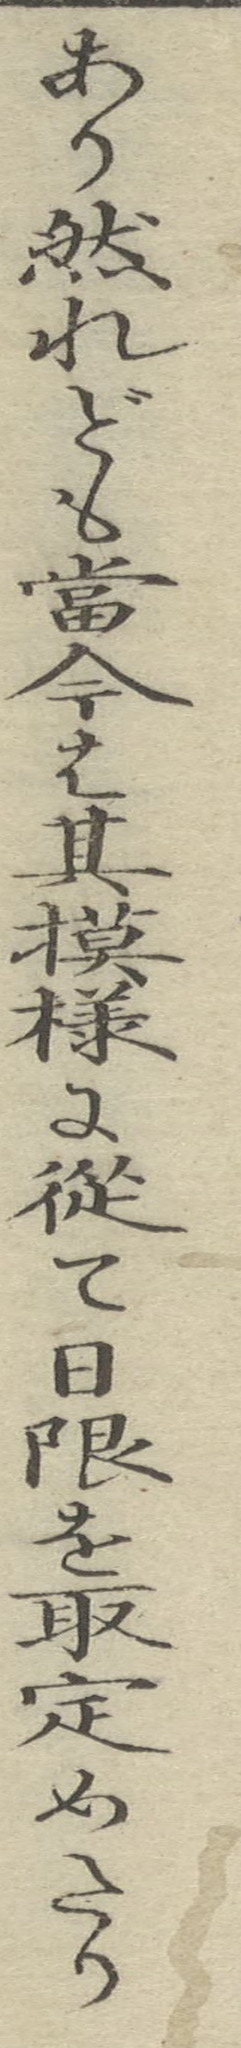あり然れども當今は其模様に従て日限を取定めたり

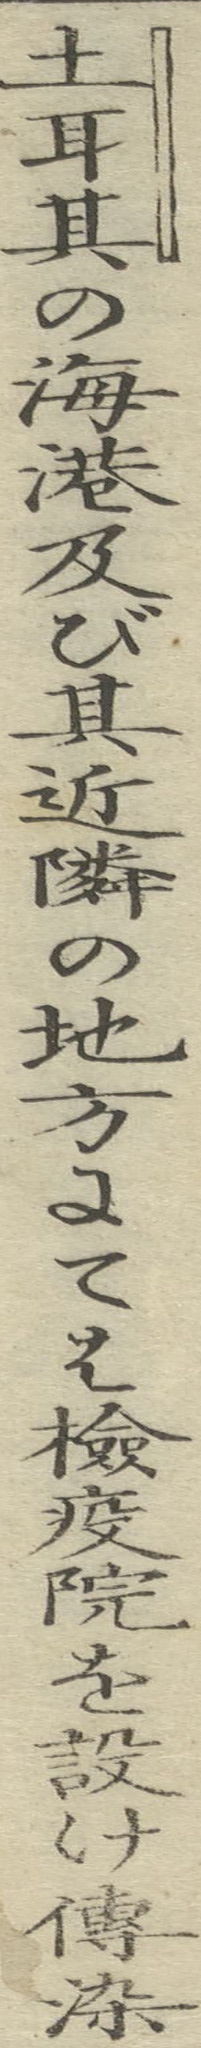土耳其の海港及び其近隣の地方にては檢疫院を設け傅染
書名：官版疫毒預防説　全
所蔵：東京大学総合図書館 General Library in the University of Tokyo, JAPAN
